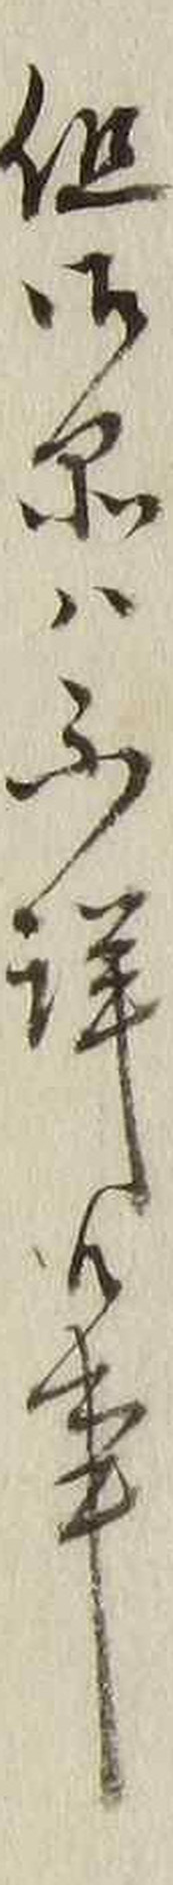但御品ハ不詳候事
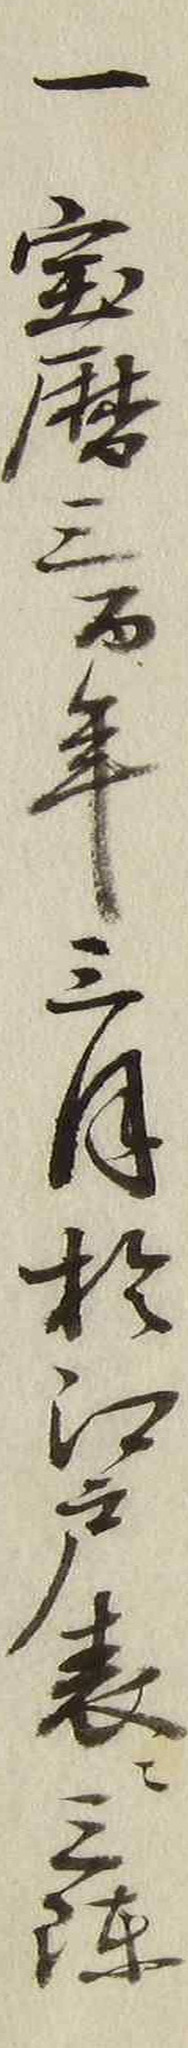一宝暦三酉年三月於江戸表ニ三陣
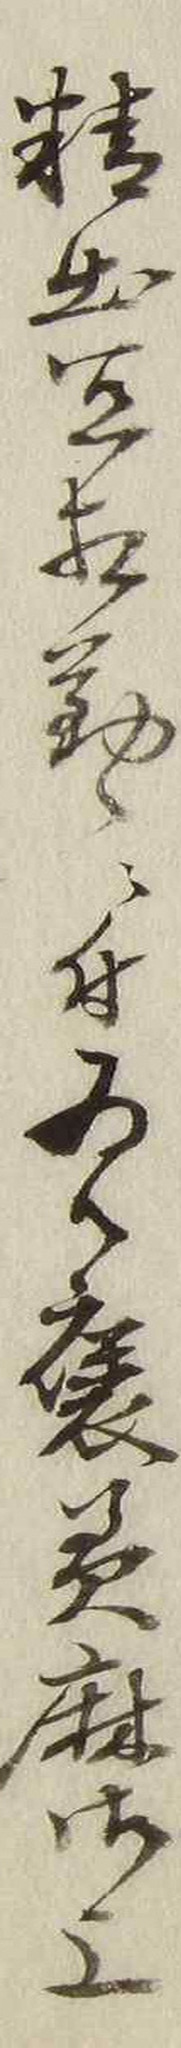精出宜相勤候ニ付為御褒美麻御上
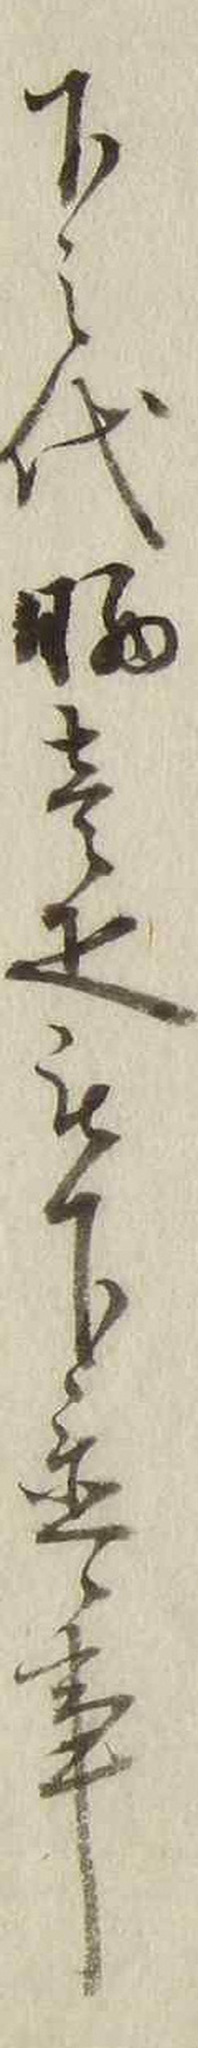下之代晒壱疋被下置候事
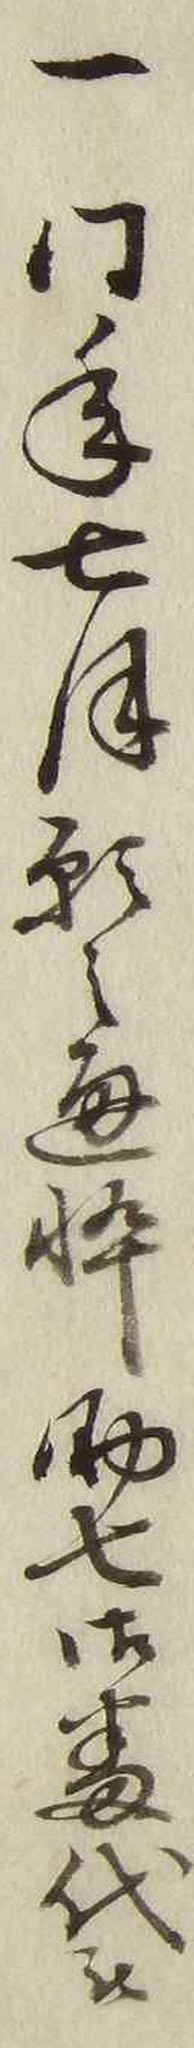一同年七月願之通忰助七御番代被

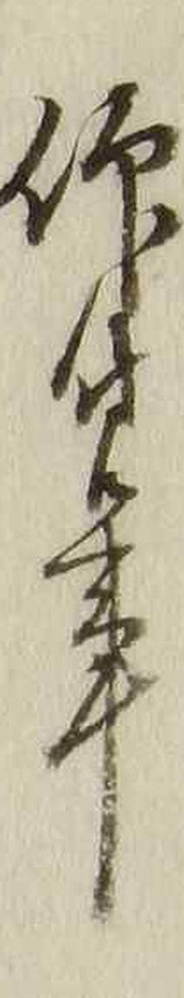仰付候事
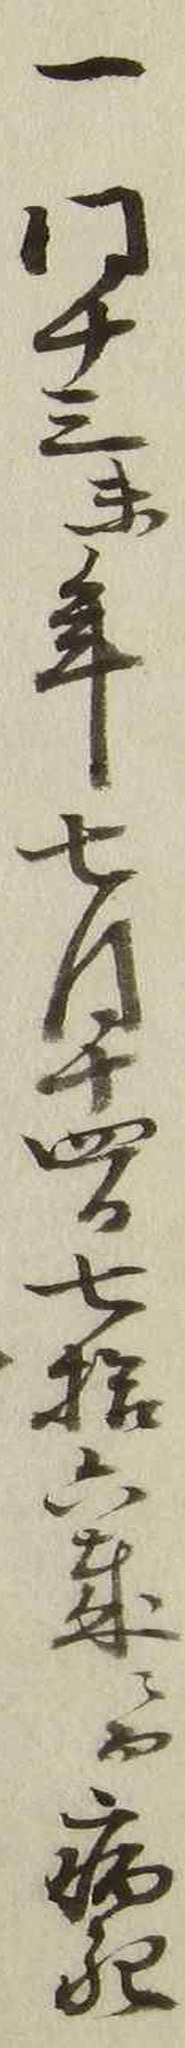一同十三未年七月十四日七拾六歳ニ而病死
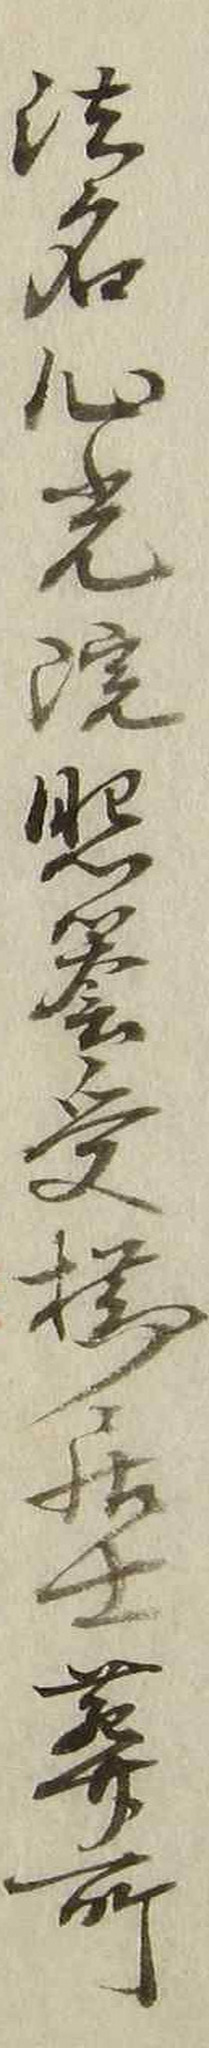法名心光院照誉受居士葬所
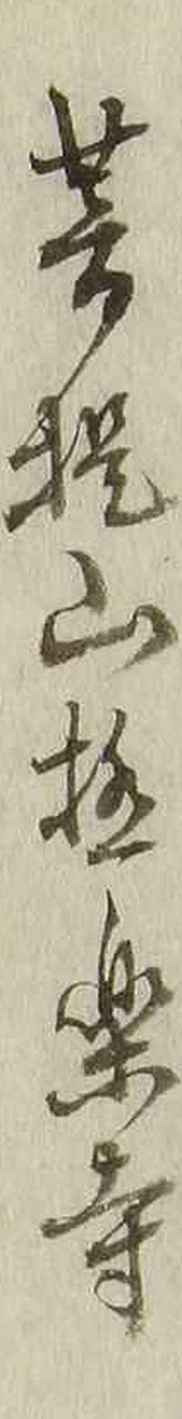菩提山極楽寺
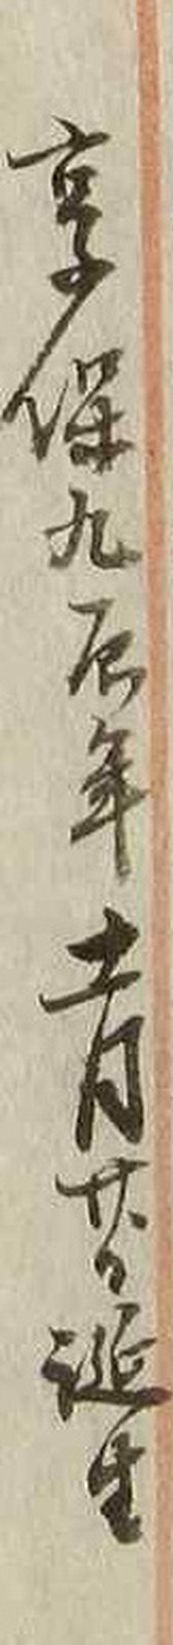享保九辰年十一月廿日誕生
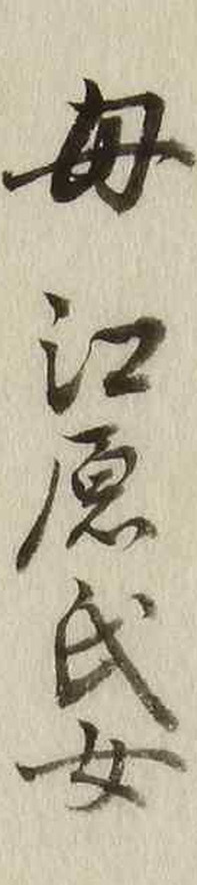母江原氏女
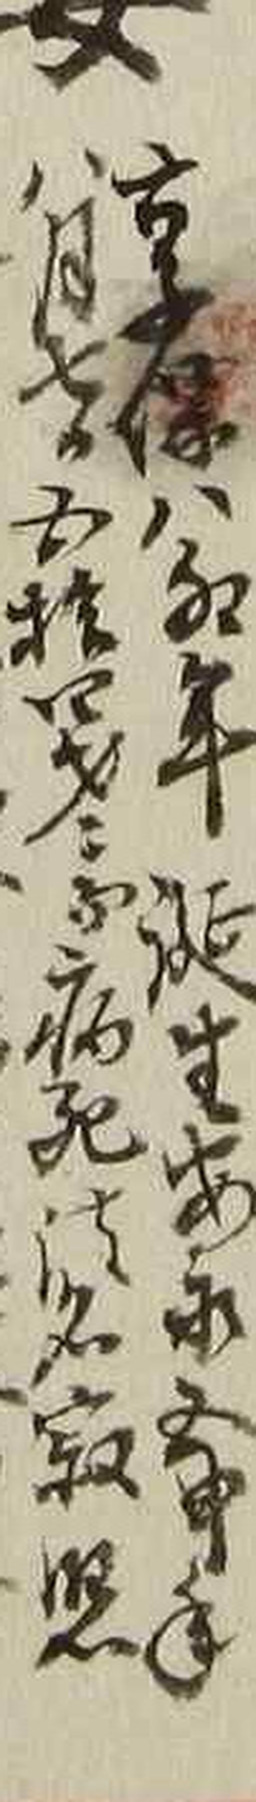八月七日五拾四才ニ而病死法名寂照
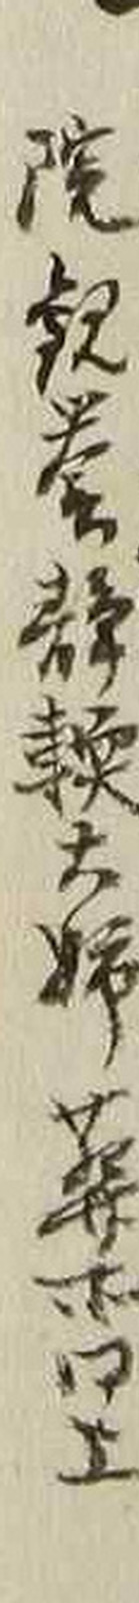院観誉静輭大姉葬所同上
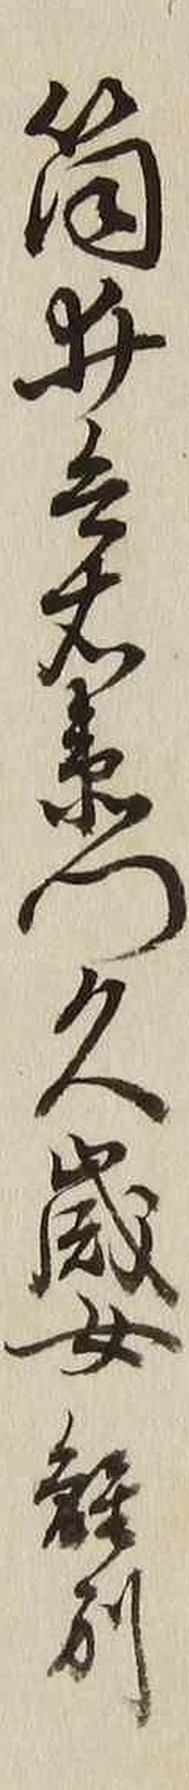筒井兵右衛門久歳女離別
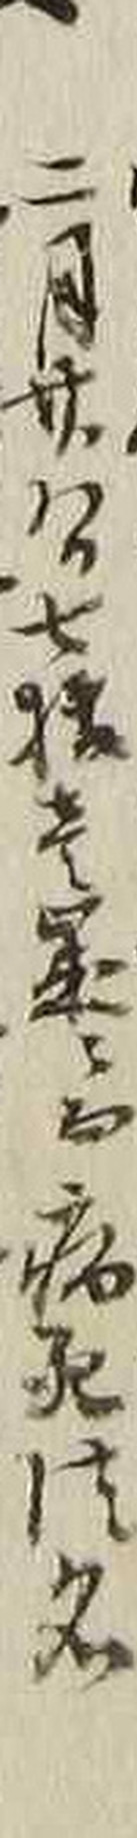二月廿八日七拾壱歳ニ而病死法名
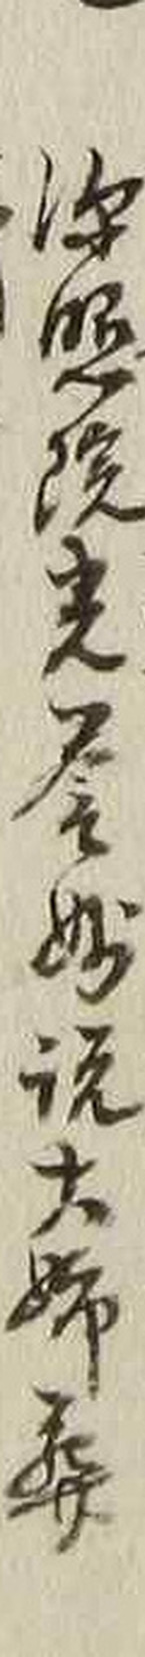深照院光誉妙説大姉葬
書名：諸士系譜　巻之27　い之部27
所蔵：会津若松市立会津図書館
